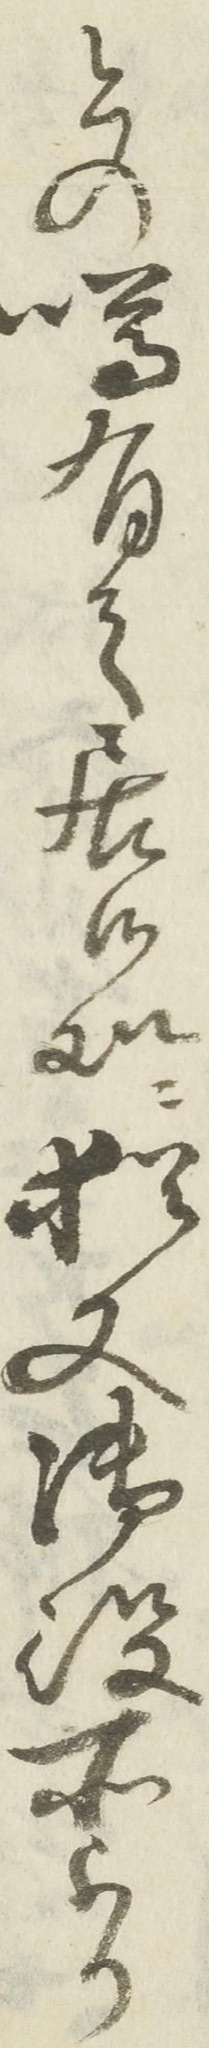との噂子有之居候処二猶又御役所より
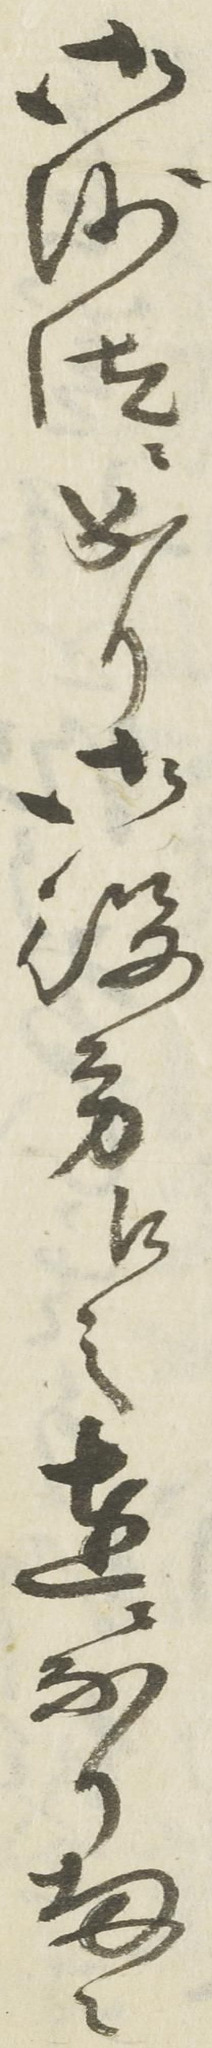御沙汰ニ成り御役方江之達ニなり扨〻
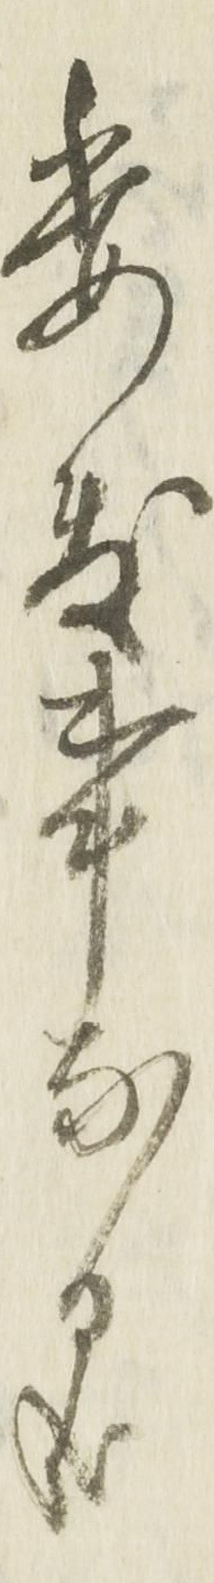委敷事なる哉
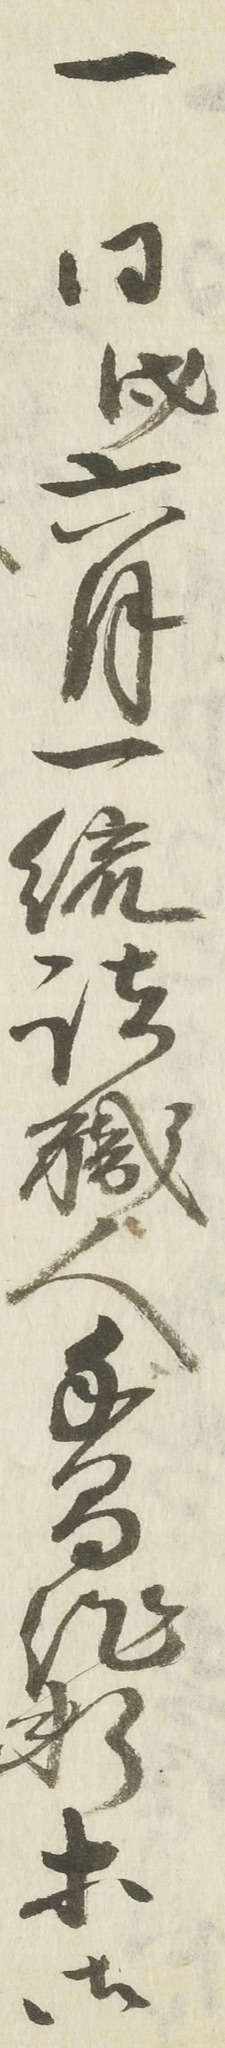一同戌六月一統諸人手間作料等御
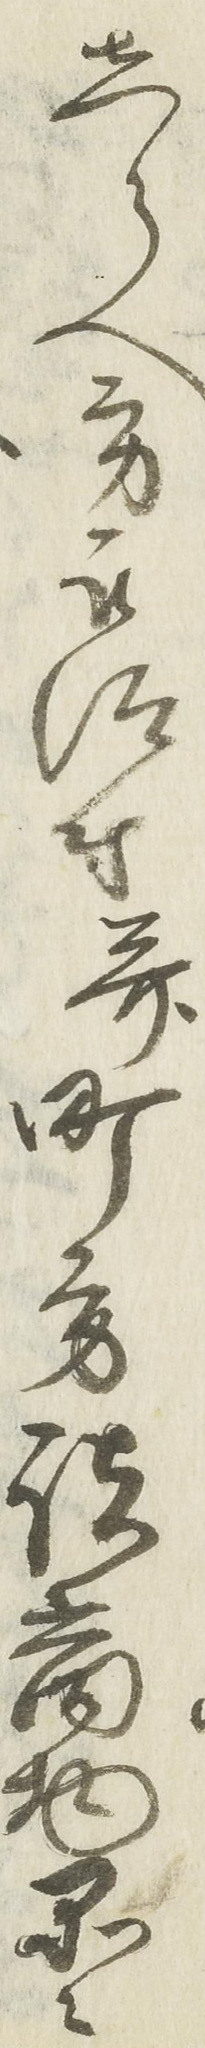しらへ方被仰付幷町方諸商物品〻
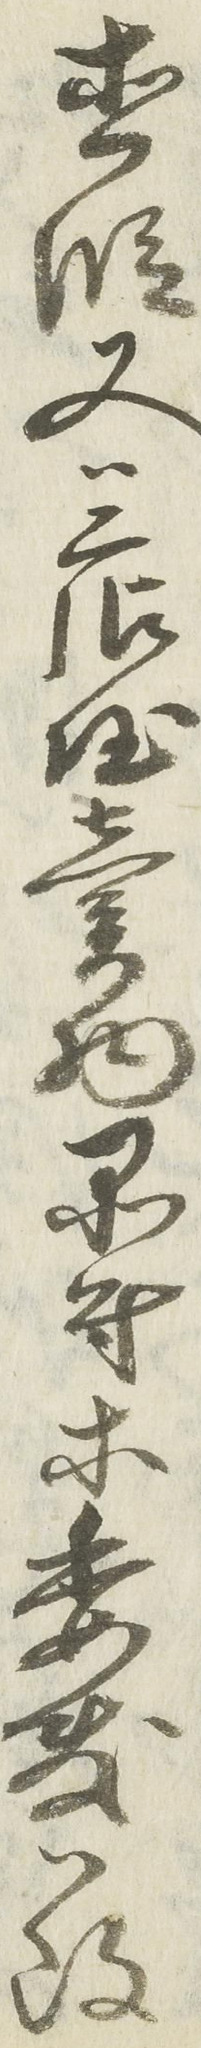直段又は店屋売物品付等委敷御改
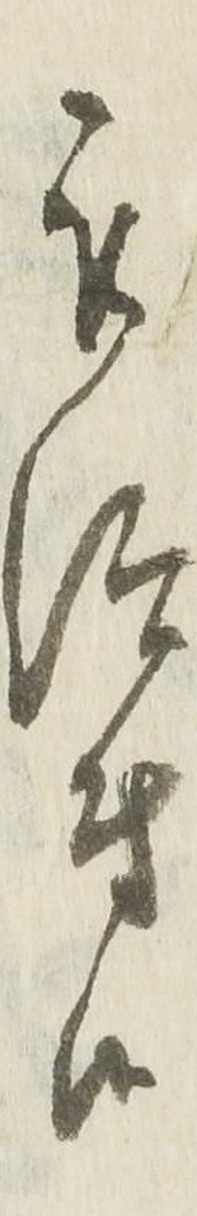被仰付候
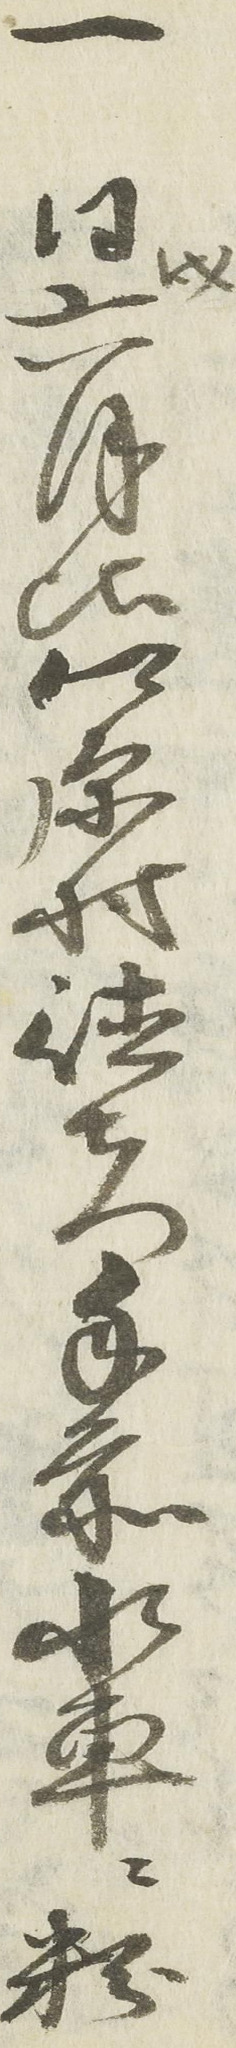一同戌六月比郷原村徳右衛門手前水車ニ粉
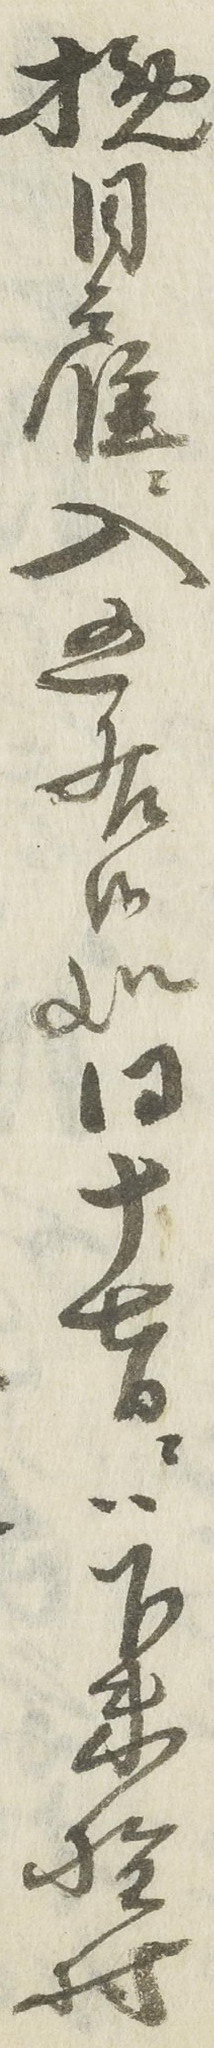挽日雇ニ入込居候処同十七日ニは下末野村
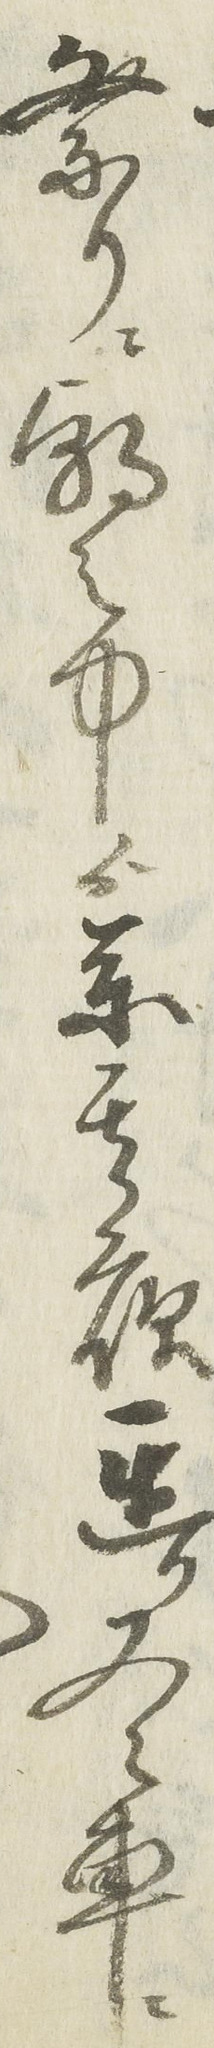祭りニ朝之中ゟ参其夜遅ク又〻車ニ
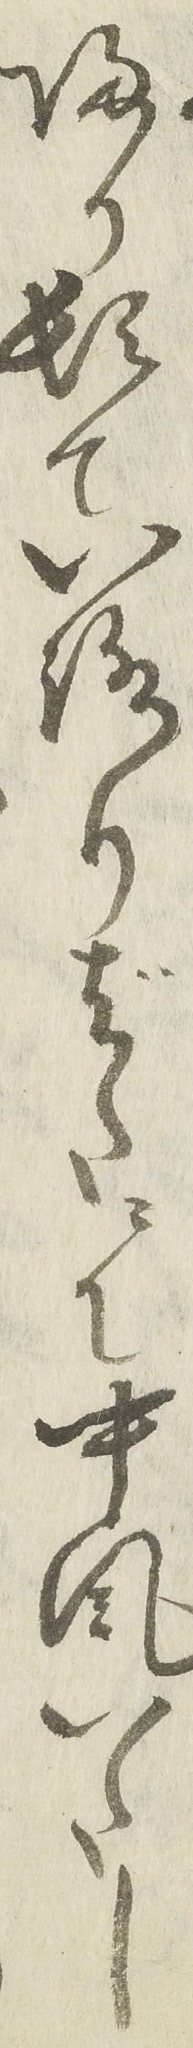帰り頓ていろりばたニて中風いたし
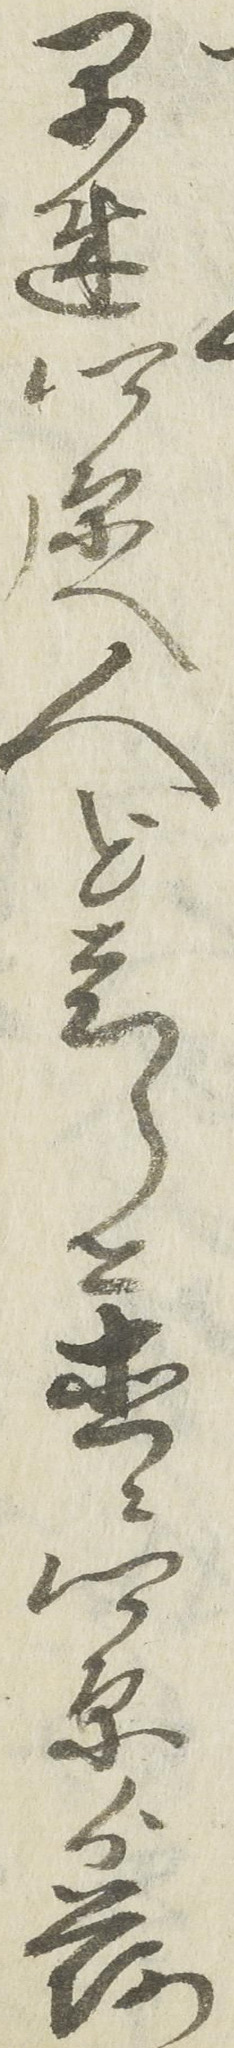早速郷原へ人を走らせ直ニ郷原ゟ荷
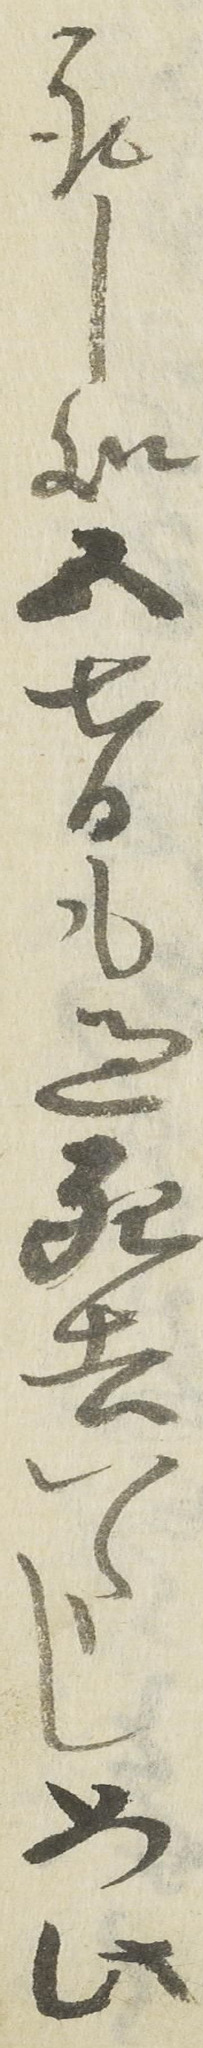取し処五七日も過死去いたし如此

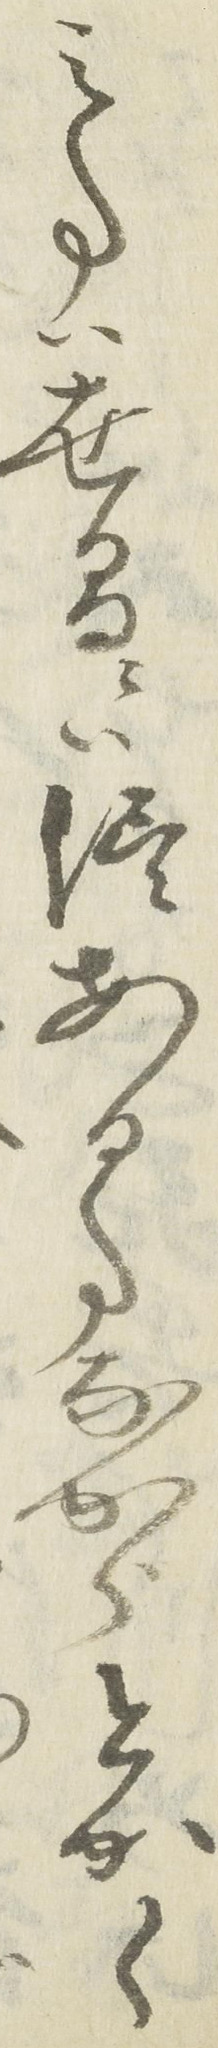之事は世間ニは侭ある事なからとかく
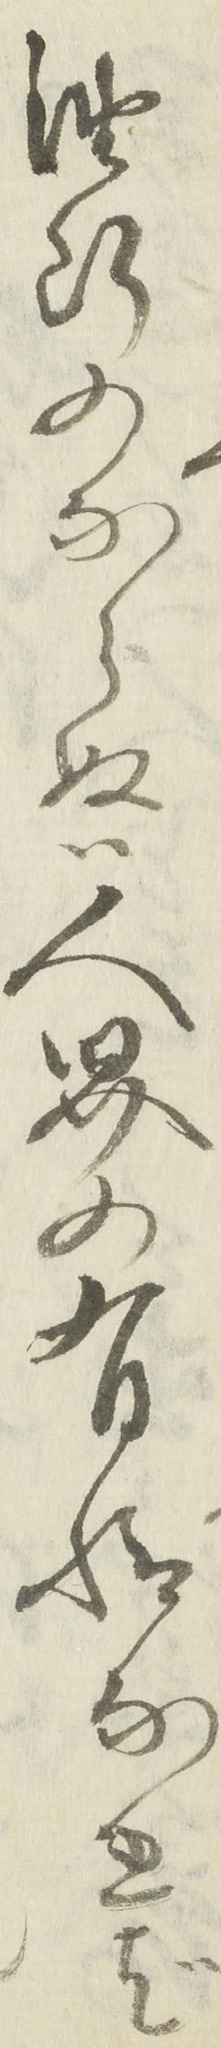油断のならぬは人界の有様なれば
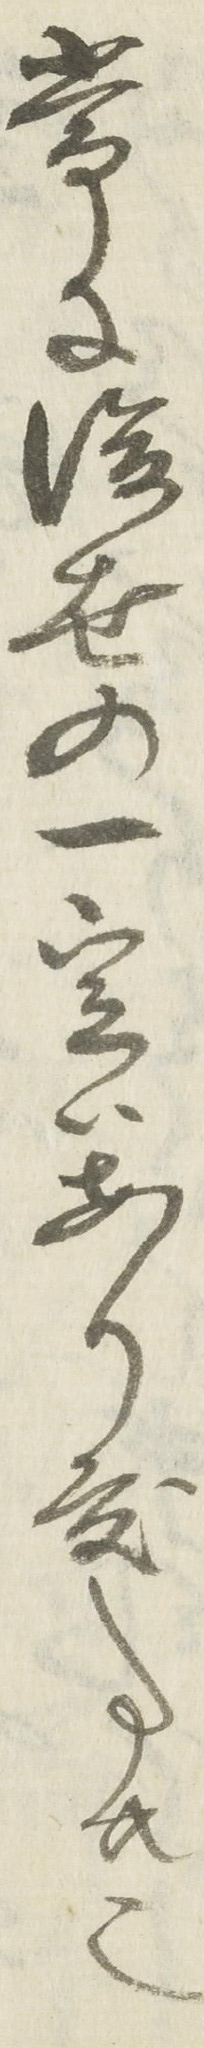常に渡世の一定はあり度事共也
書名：後見笑
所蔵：東京大学地震研究所図書室 Earthquake Research Institute Library, The University of Tokyo, JAPAN
